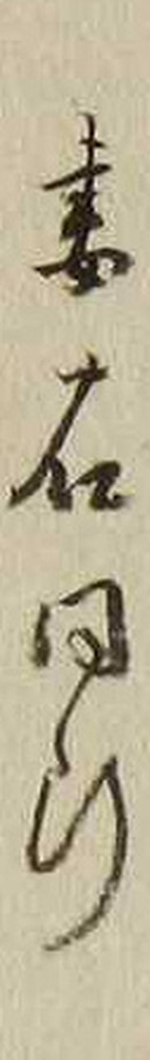妻右同断
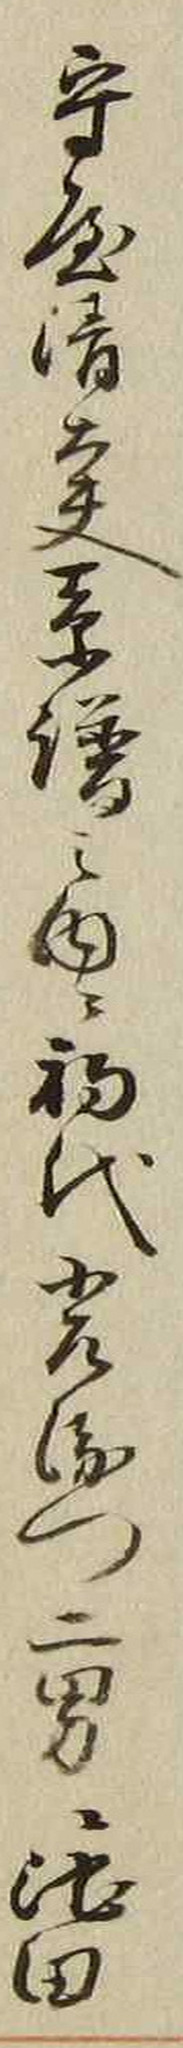守屋清太夫系譜之内ニ初代小左衛門二男ニ池田
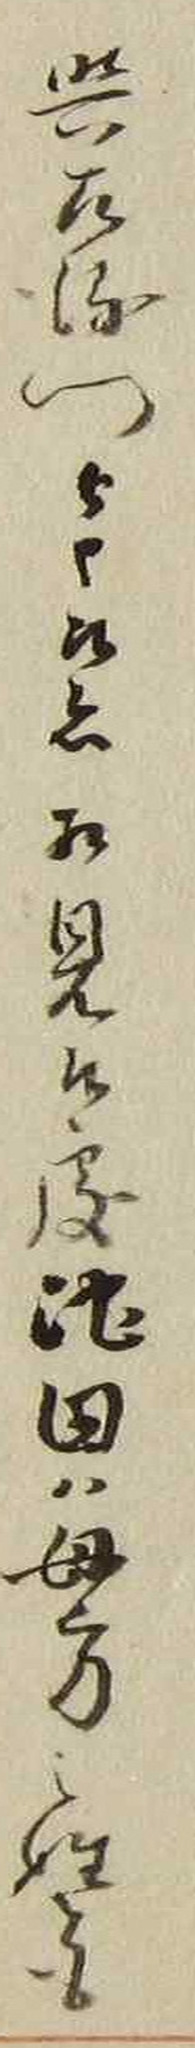與左衛門と申候者相見候処池田ハ母方之姓とも
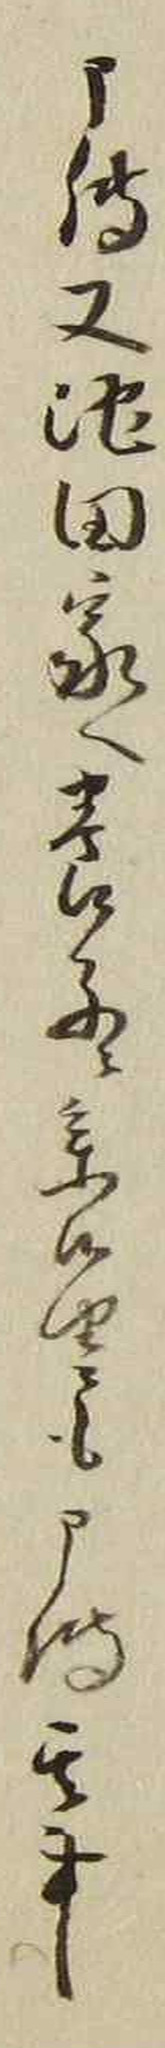申伝又池田家へ養子に参候由ニも申伝其事

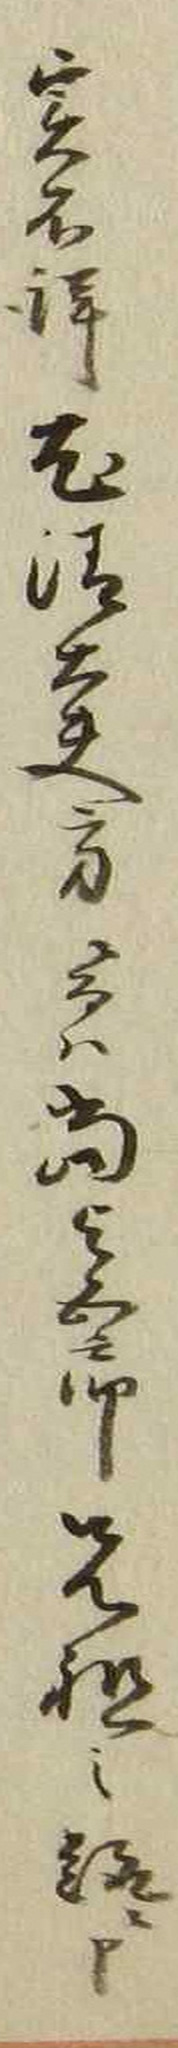実不詳尤清太夫方ニ而ハ当与五郎先祖之趣ニ申
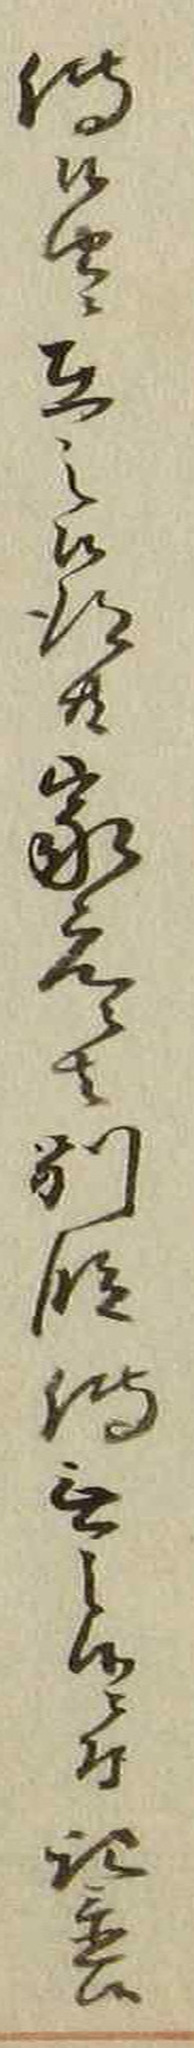伝候由ニ在之候得共家元ニ者別段伝無之候ニ付記置候
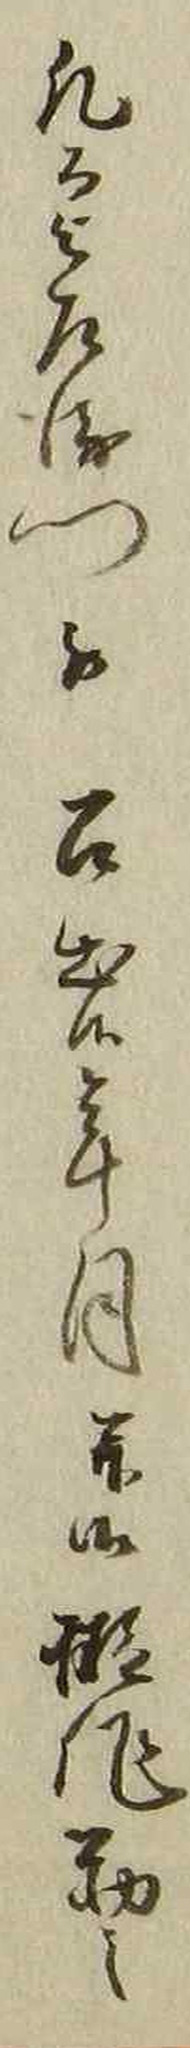凡而与左衛門被召出候年月幷御擬作勤之
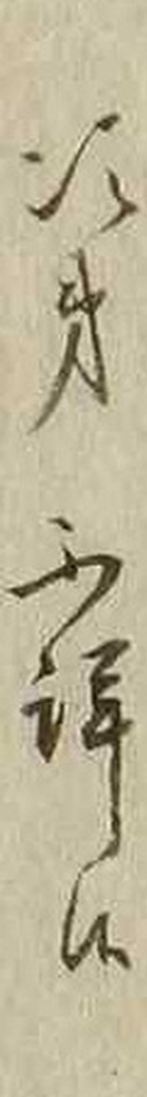次第不詳候
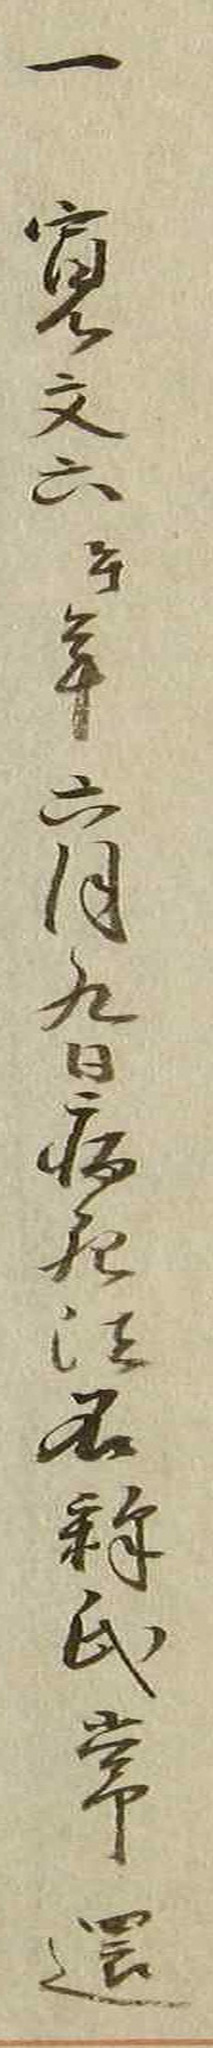一寛文六午年六月九日病死法名釈氏常還
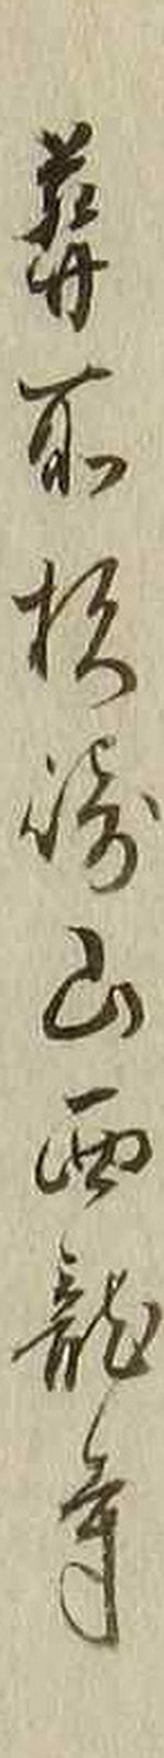葬所杉崎山西龍寺
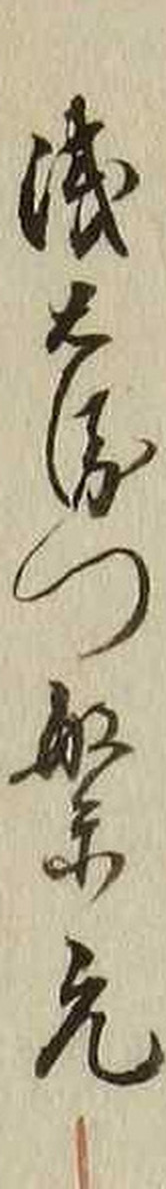浅右衛門繁元
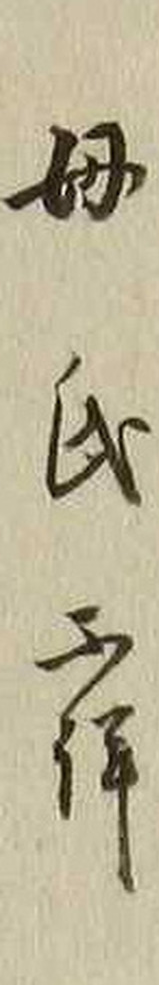母氏不詳
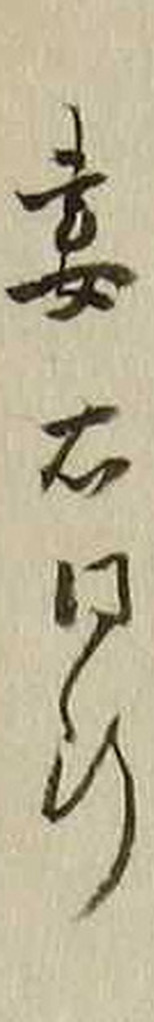妻右同断
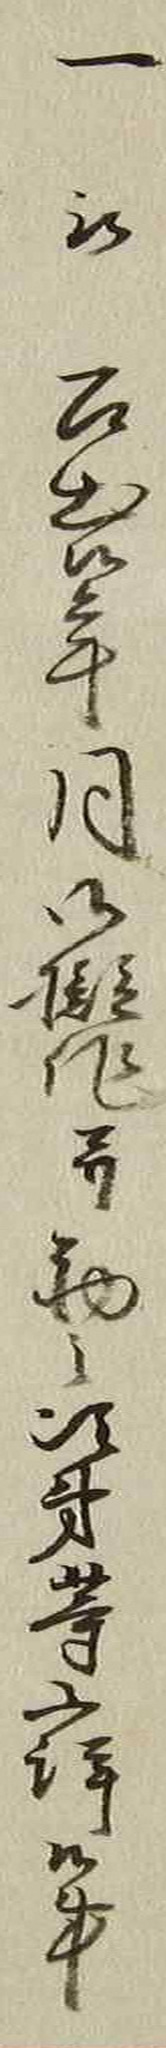一被召出候年月御擬作幷勤之次第等不詳候事
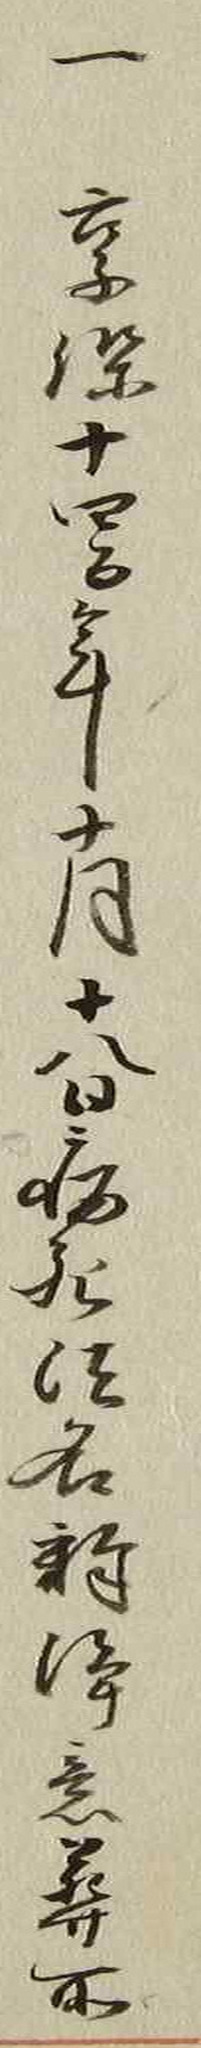一享保十四酉年十月十八日病死法名釈浄意葬所
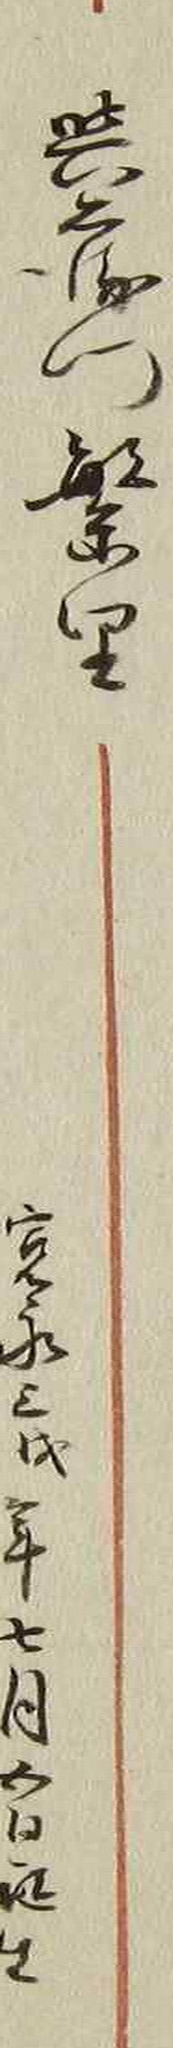与右衛門繁里寛永三戌年七月五日誕生
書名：諸士系譜　巻之32　い之部32
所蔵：会津若松市立会津図書館
